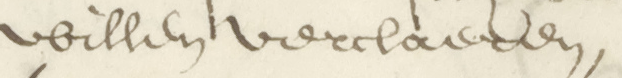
willen verclaeren.
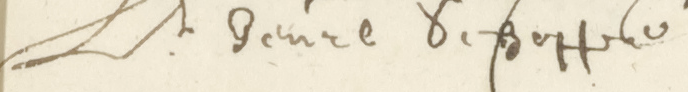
Lt Genrl Schoppe
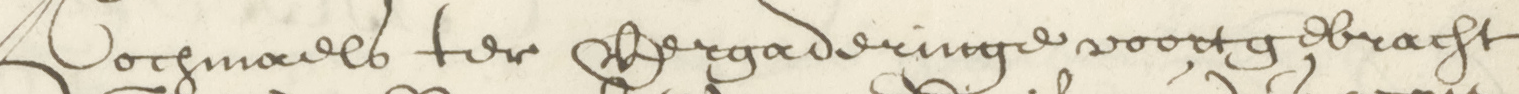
Nochmaels ter Vergaderinge voortgebracht
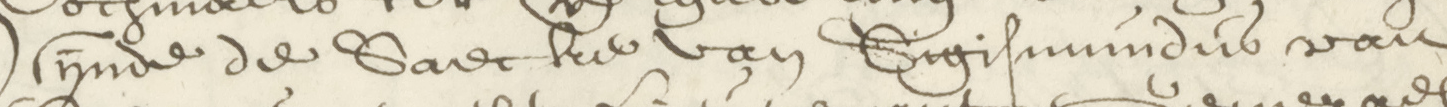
sijnde de Saecke van Sigismundus van
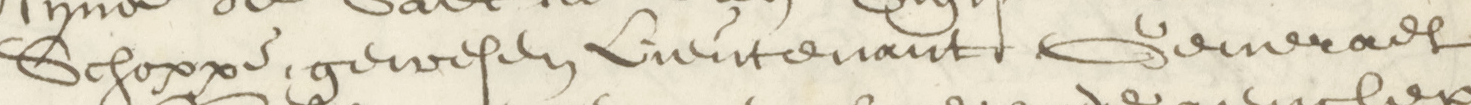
Schoppe, gewesen Lieutenant Generael
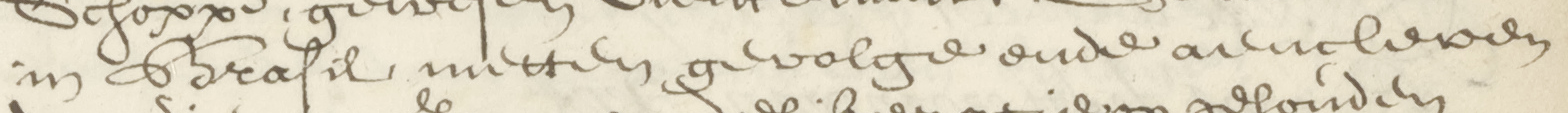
in Brasil, metten gevolge ende aencleven
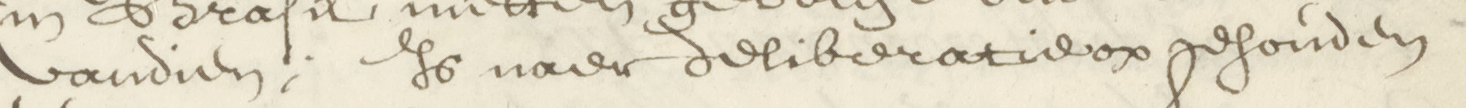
vandien; Is naer deliberatie op gehouden
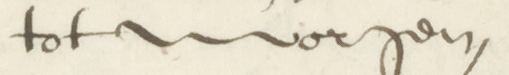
tot morgen.
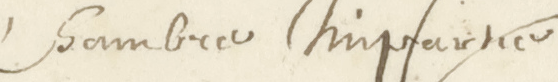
Chambre Mipartie
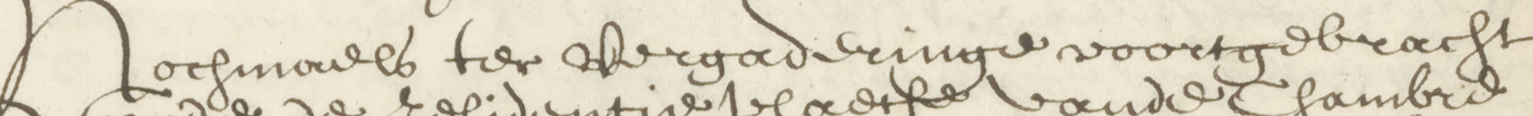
Nochmaels ter Vergaderinge voortgebracht
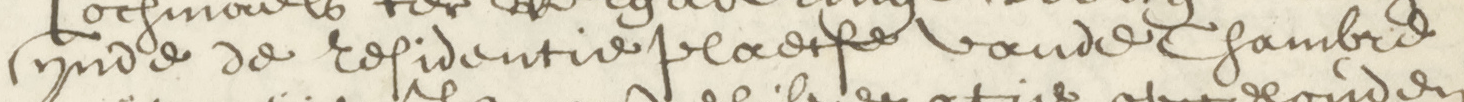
sijnde de residentieplaetse vande Chambre
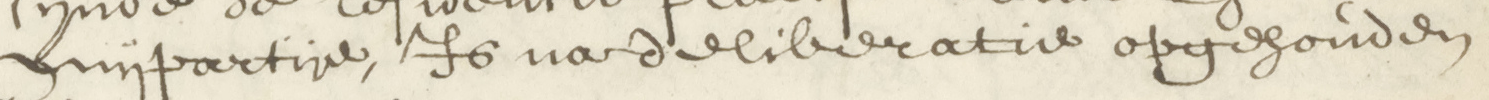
Mijpartije, Is na deliberatie opgehouden
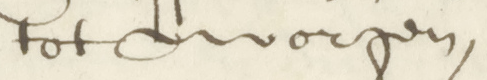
tot morgen.
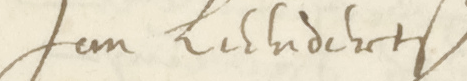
Jan Leendertsz
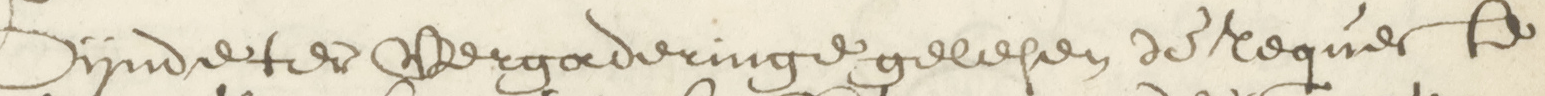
Sijnde ter Vergaderinge gelesen de Requeste
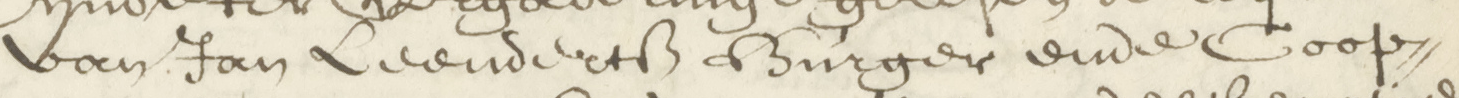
van Jan Leendertsz Burger ende Coop„
